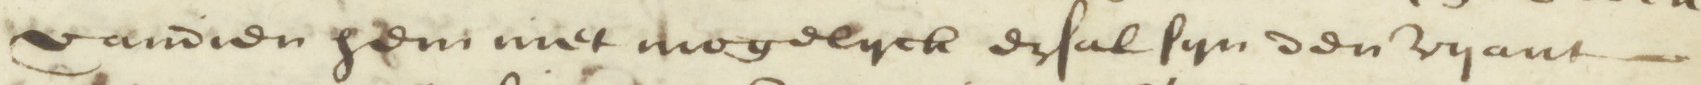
vandien hem niet mogelyck en sal syn den vyant —
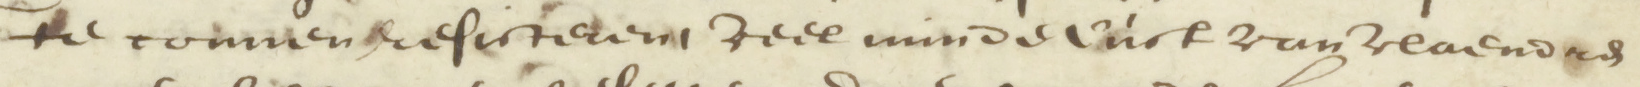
te connen resicteren, veel minde Cust van Vlaenderen
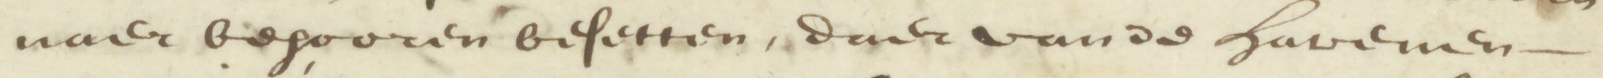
naer behooren besetten, daer vande Havenen —
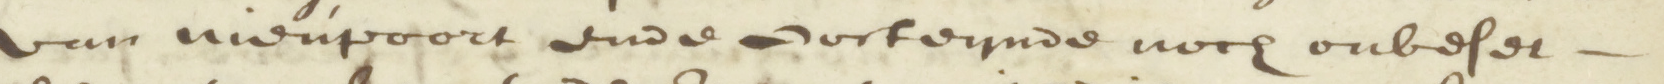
van nieupoort ende Oosteynde noch onbeset —
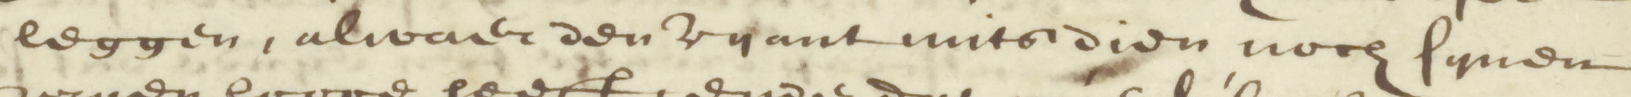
leggen, alwaer den vyant mits dien noch synen
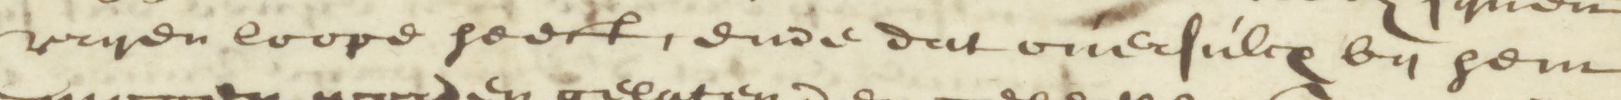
vryen loope heeft, ende dat oversulcx by hem
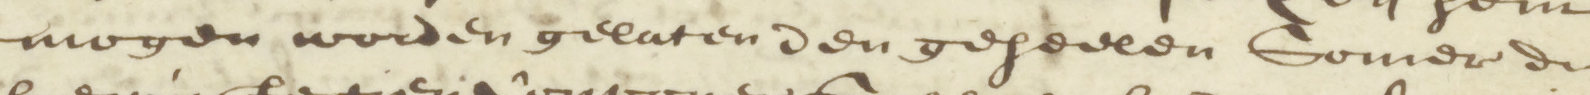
mogen worden gelaten den geheelen Somer de
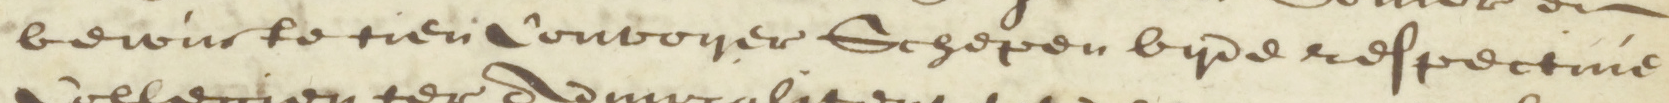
bewuste tien Convoyer Schepen byde respective
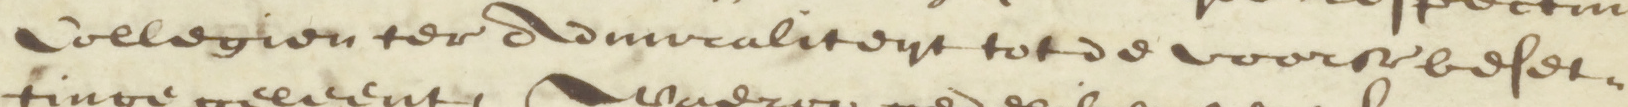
Collegien ter Admiraliteyt tot de voorsz beset„
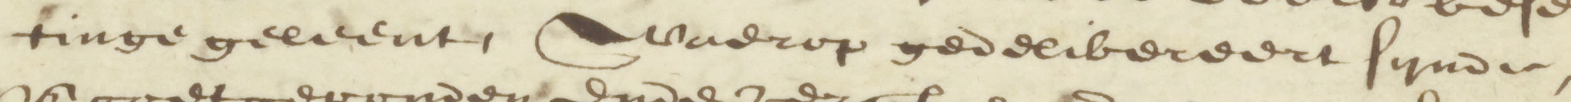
tinge geleent. Waerop gedelibereert synde,
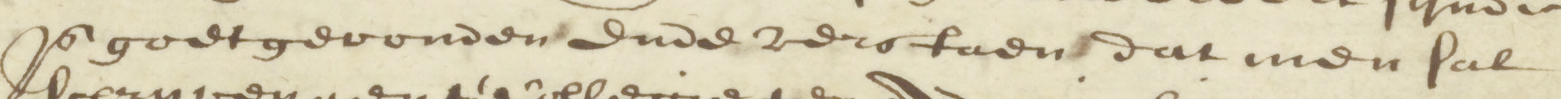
Is goetgevonden ende verstaen dat men sal
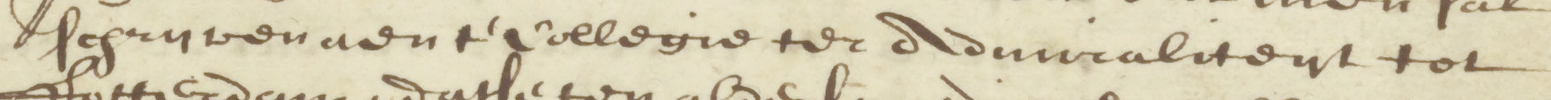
schrijven aen t‛Collegie ter Admiraliteyt tot
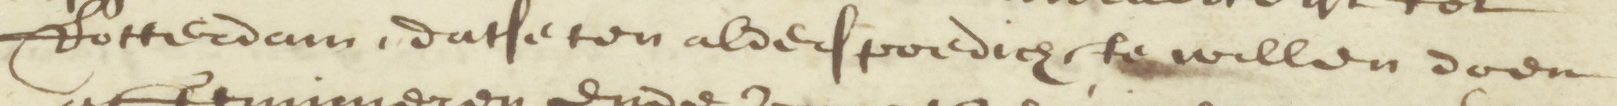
Rotterdam, datse ten alderspoedichste willen doen
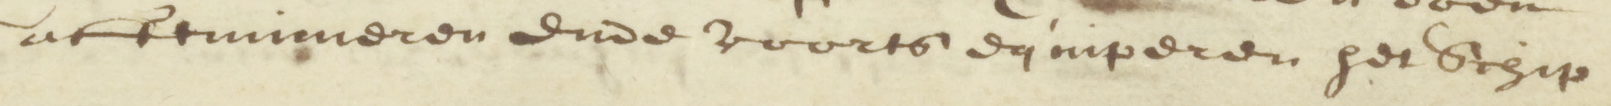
afftimmeren ende voorts equiperen het Schip
